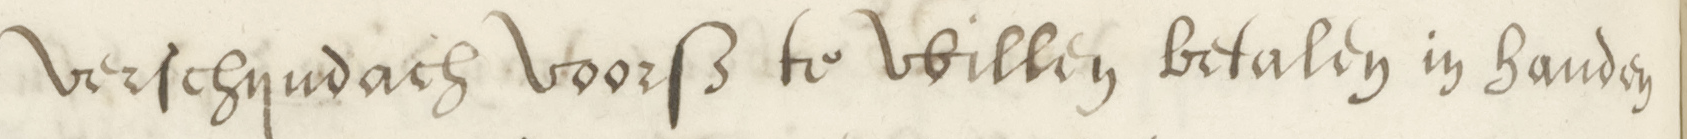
verschyndach voors te willen betalen in handen
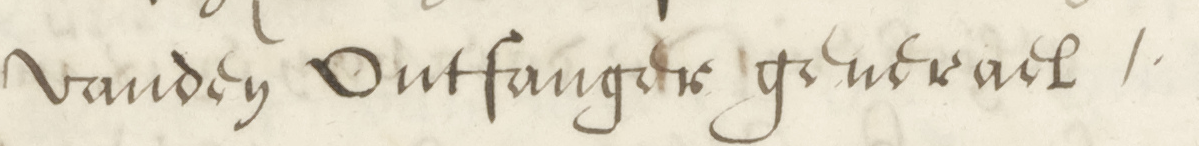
vanden Ontfanger generael.
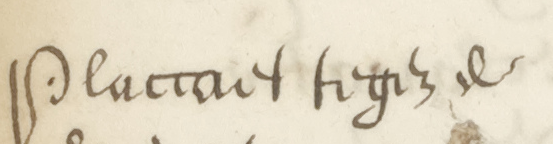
Placcaet tegen de
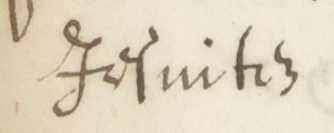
Jesuiten
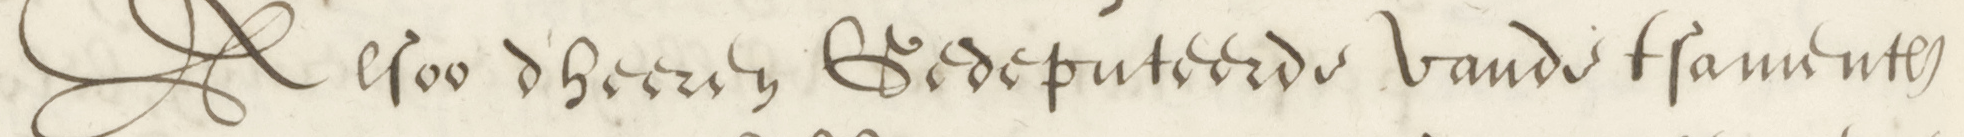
Alsoo d'heeren Gedeputeerde vande tsamentl
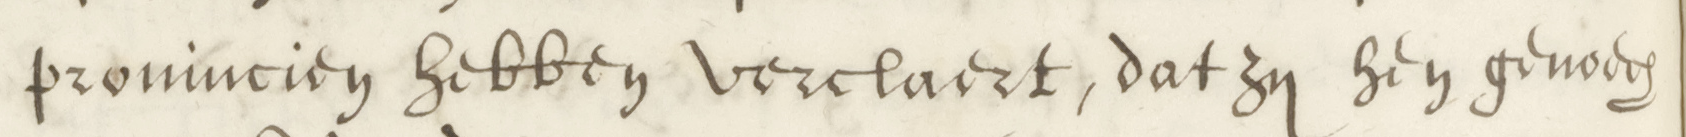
prouincien hebben verclaert, dat zy hen genoech
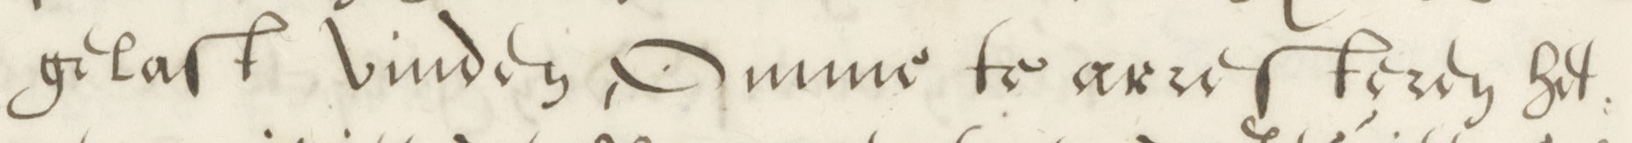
gelast vinden, Omme te arresteren het
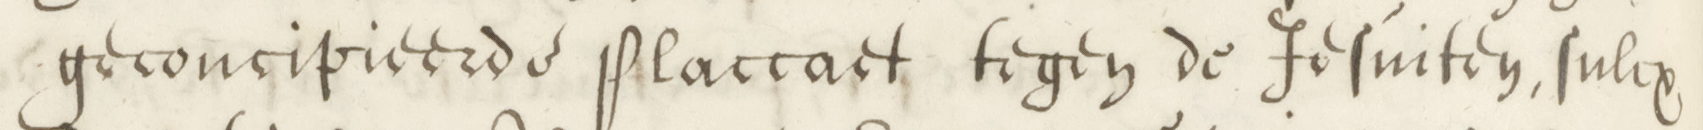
geconcipieerde Placcaet tegen de Jesuiten, sulcx
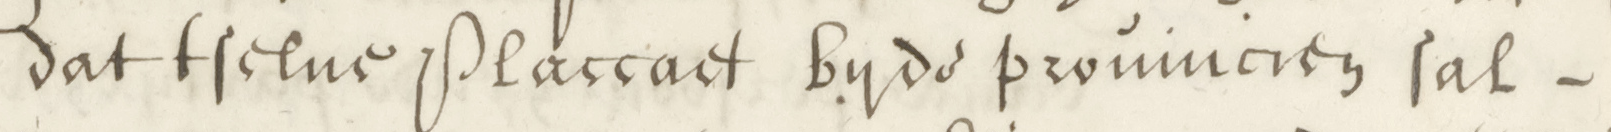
dat tselue Placcaet byde prouincien sal -
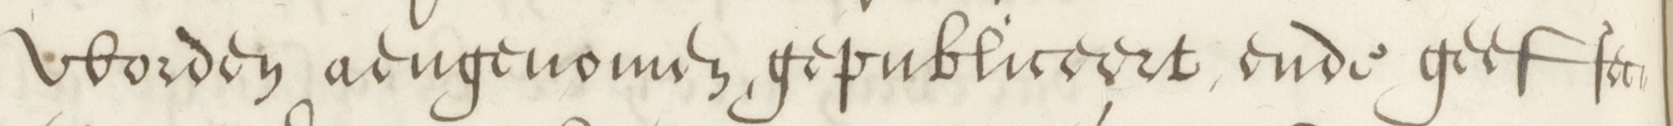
worden aengenomen, gepubliceert, ende geeffec„
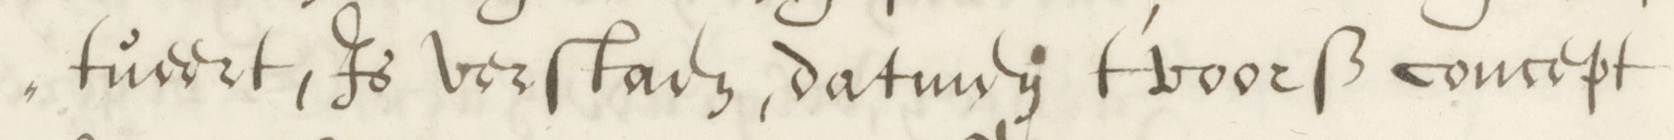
„tueert, Is verstaen, datmen t‛voors concept
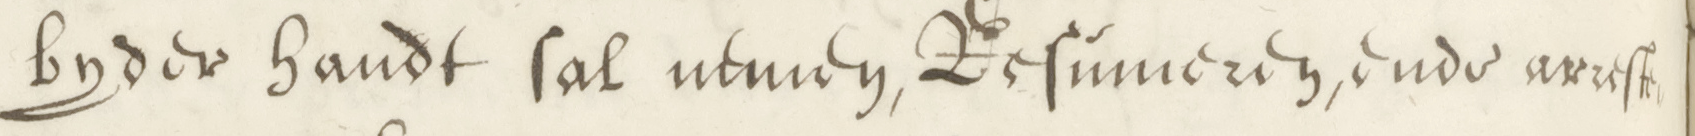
byde handt sal nemen, Resumeren, ende arreste„
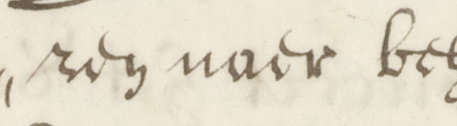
„ren naer behooren.
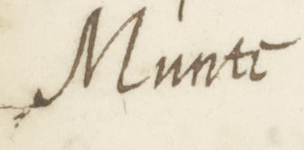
Munte
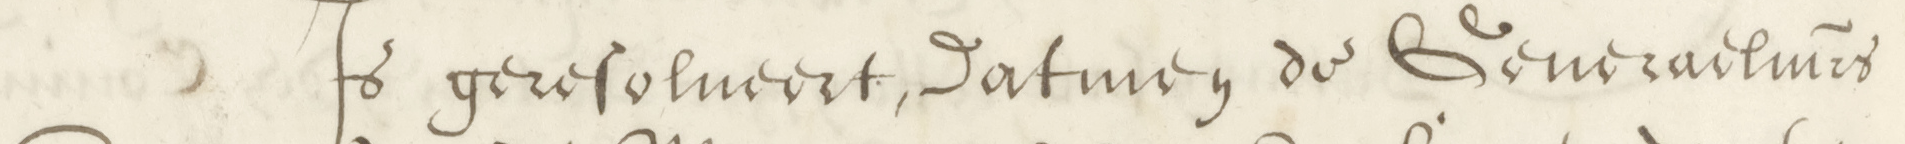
Is geresolueert, datmen de Generaelmrs
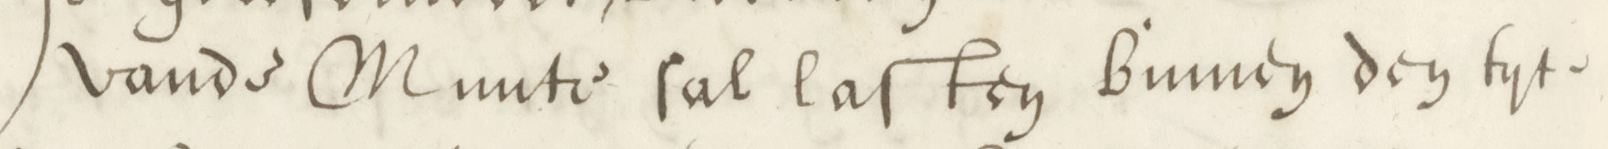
vande Munte sal lasten binnen den tyt
